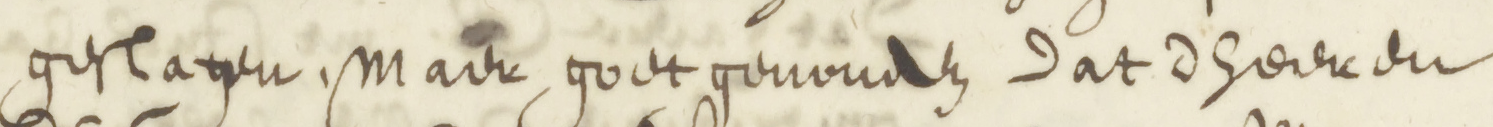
geslagen, maer goetgevonden dat dheeren
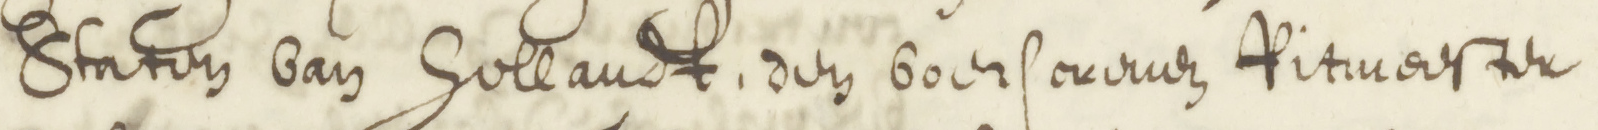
Staten van Hollandt, den voerscreven Ritmeester
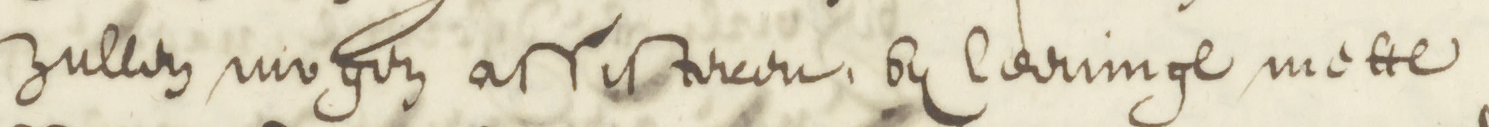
zullen mogen assisteren, by leeninge mette
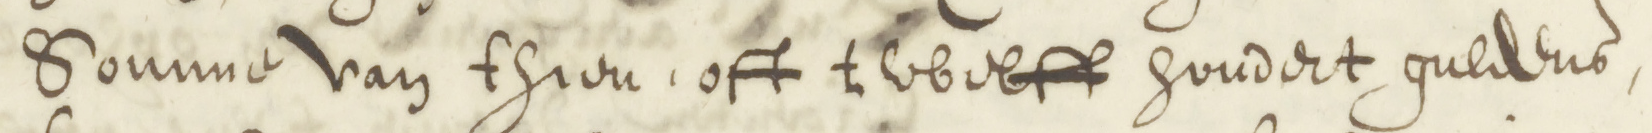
Somme van thien, off twelff hondert guldens,
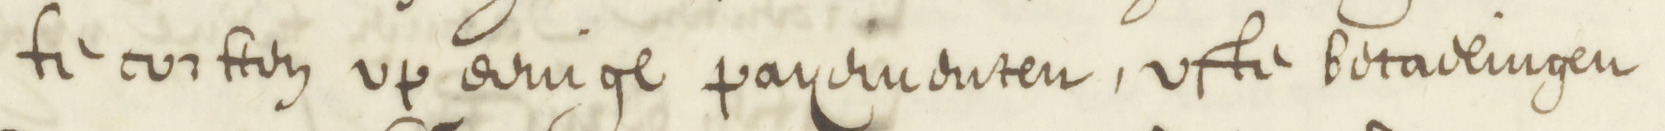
te cortten op eenige payementen, ofte betaelingen
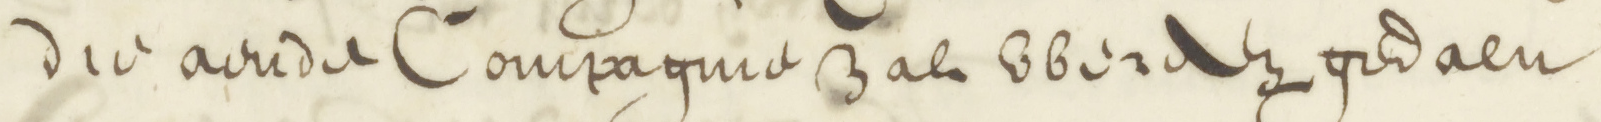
die aende Compagnie zal werden gedaen.
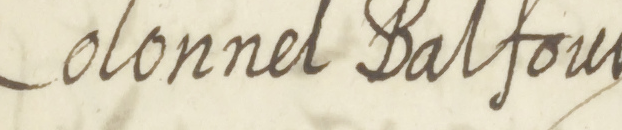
Colonnel Balfour
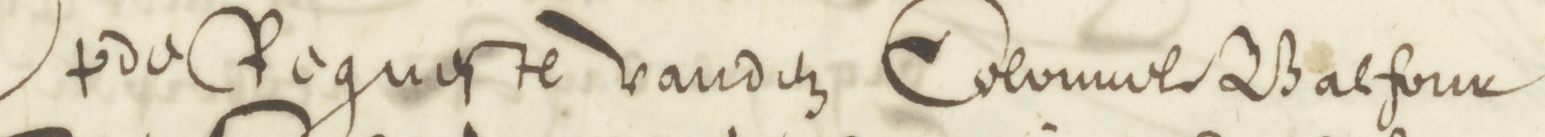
Opde Requeste vanden Colonnel Balfour
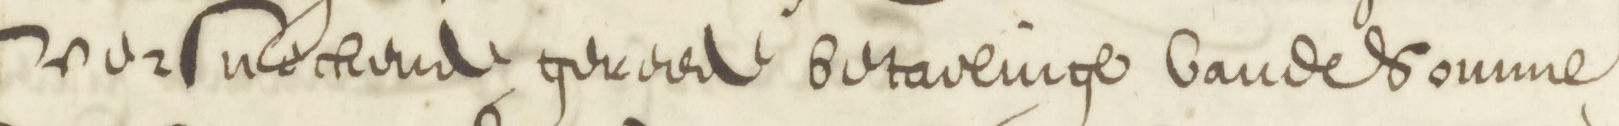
versueckende gereede betaelinge vande Somme
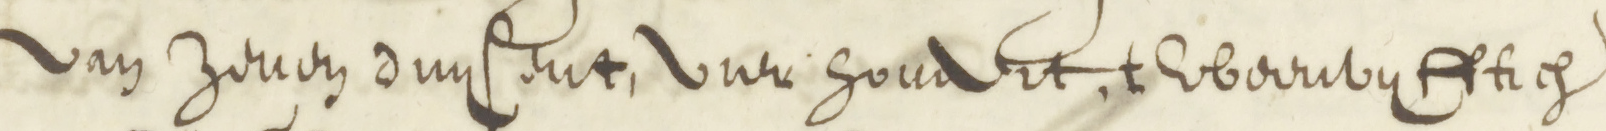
van zeven duysent, vier hondert, tweenvyfftich
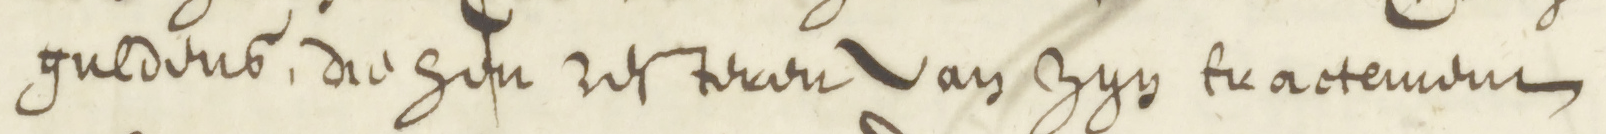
guldens, die hen resteren van zijn tractement
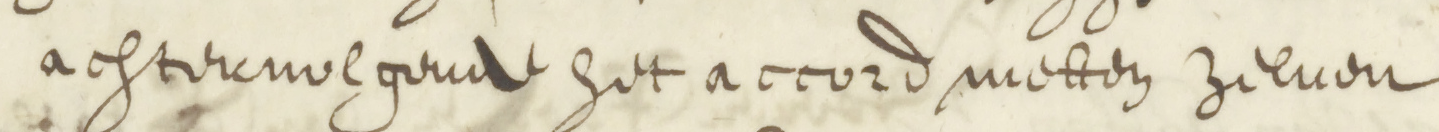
achteruolgende het accord metten zelven
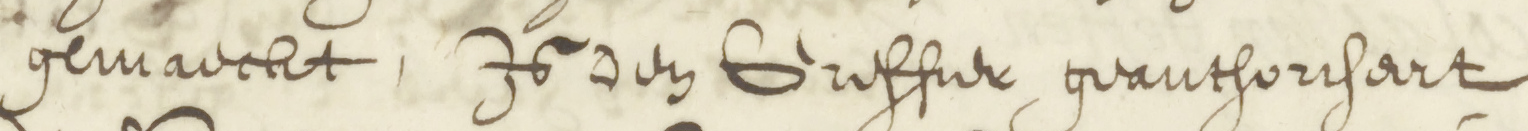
gemaeckt. Is den Greffier geauthoriseert
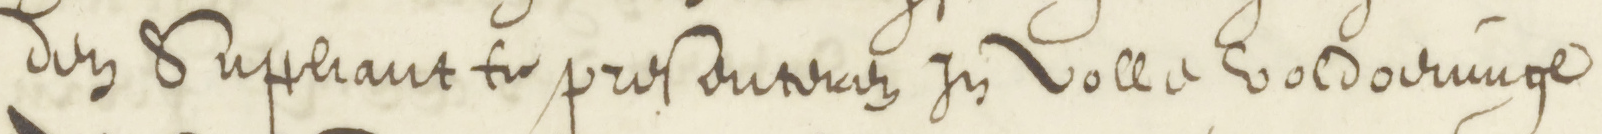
den Suppliant te presenteren In volle voldoeninge
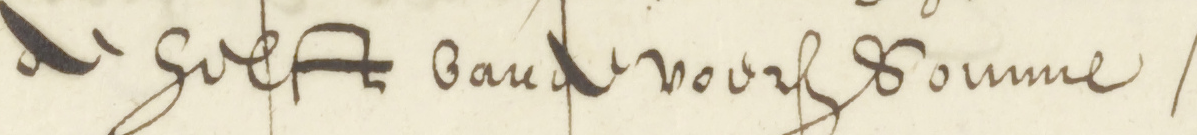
de helft vande voers Somme.
